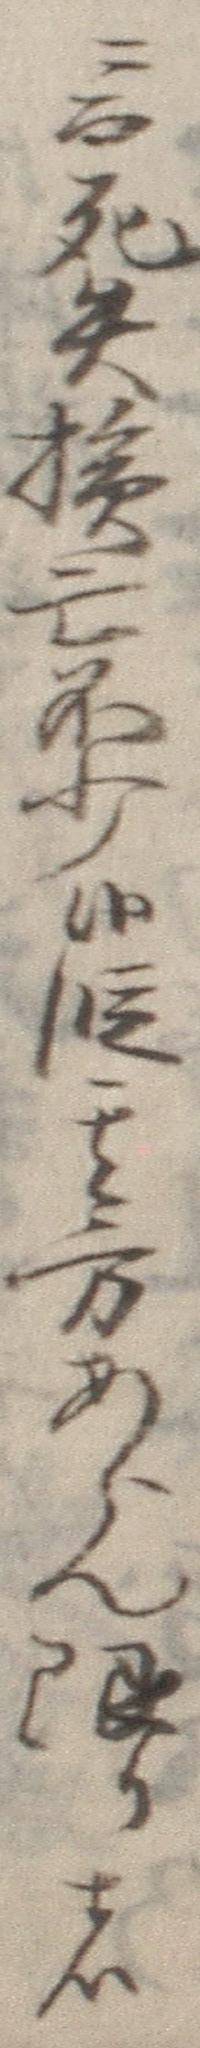二而死失損亡不少候段其方あらん限りは
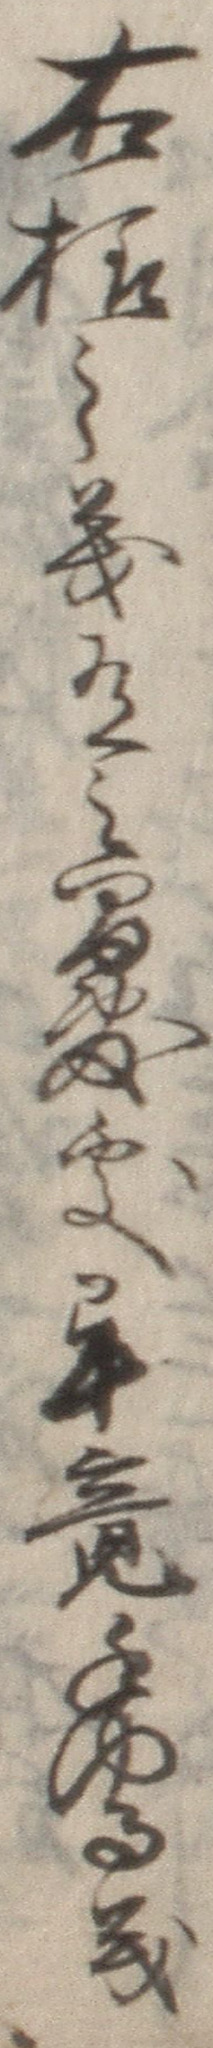右様之義有之間敷處畢竟てゆる義
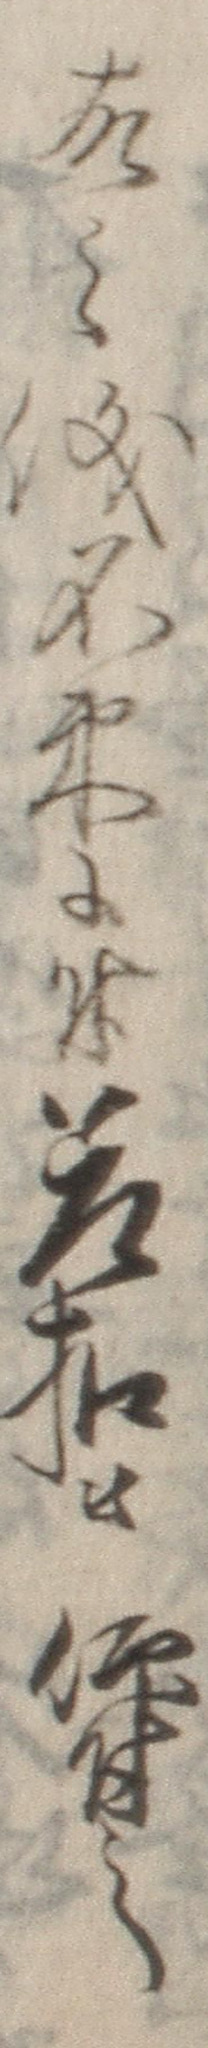故之義不束に付差扣被仰付之
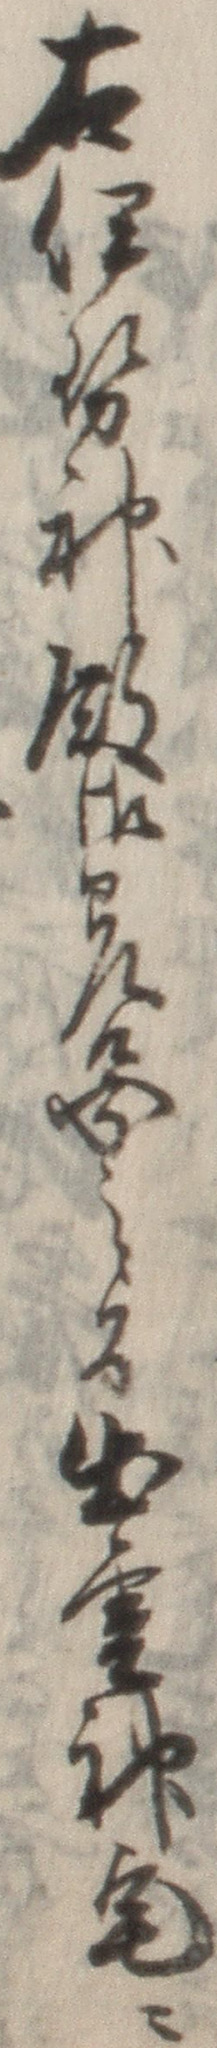右伊勢神殿御差図之間出雲神宅二
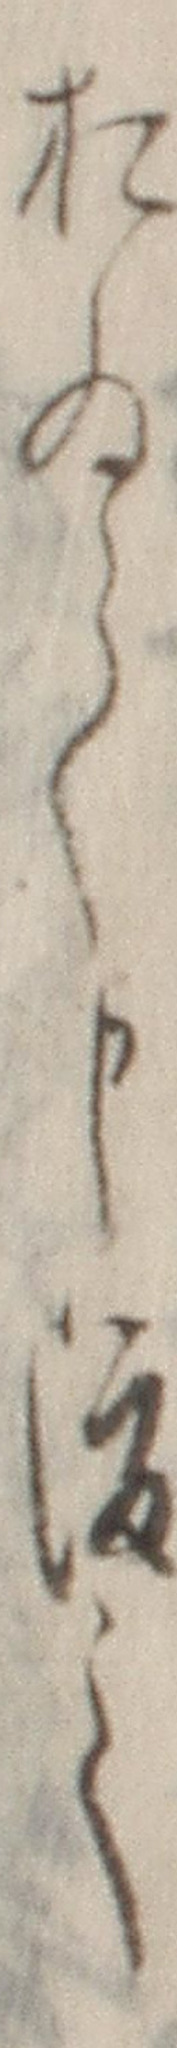おゐて申渡之
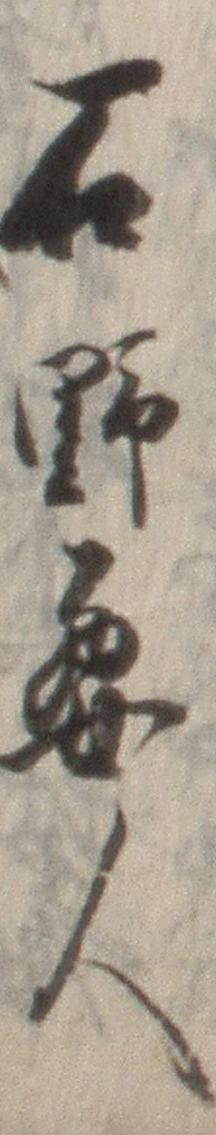石野要人
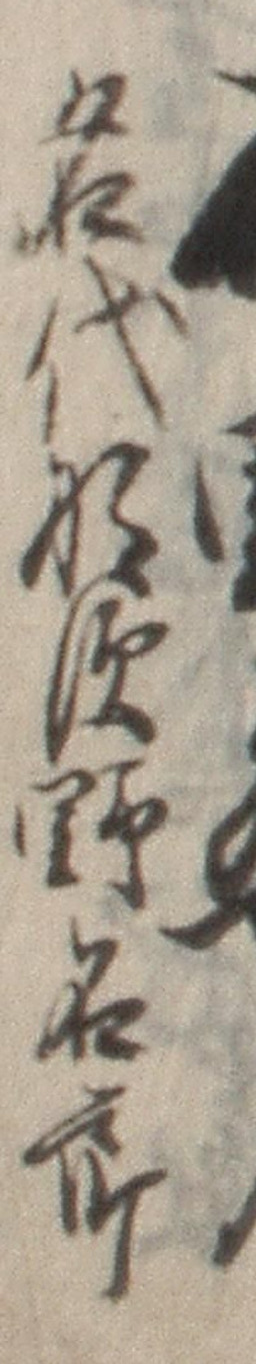名代那須野石郎

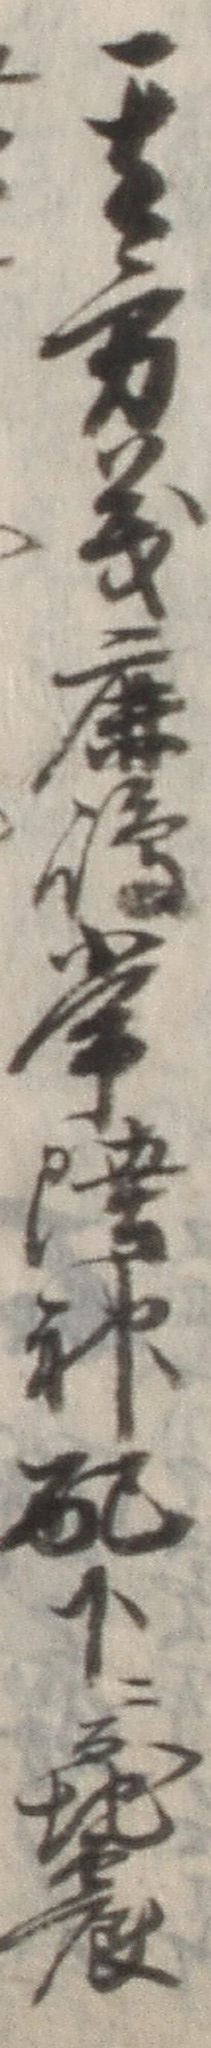其方義鹿嶋常陸神配下二て地震
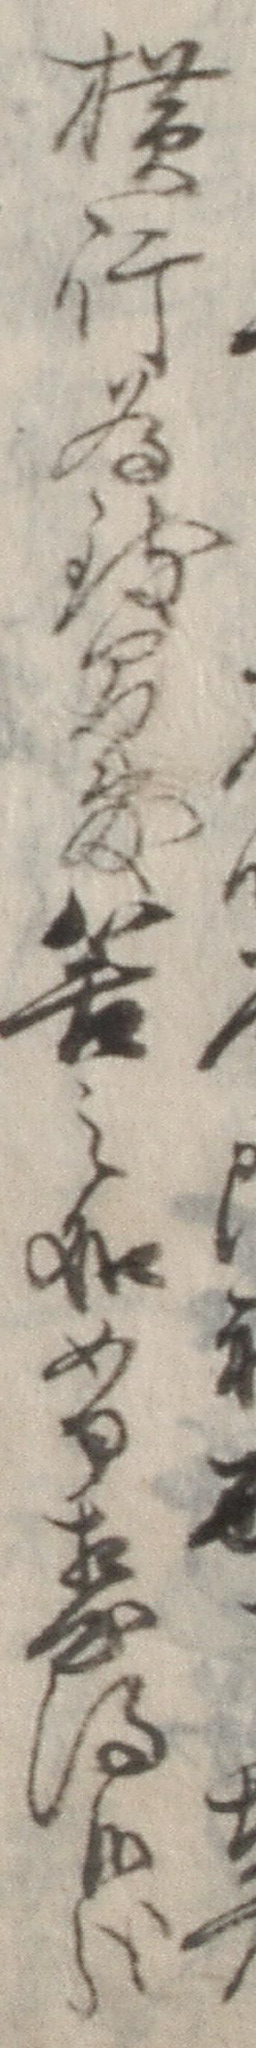横行為致間敷筈之処如何相心得候哉
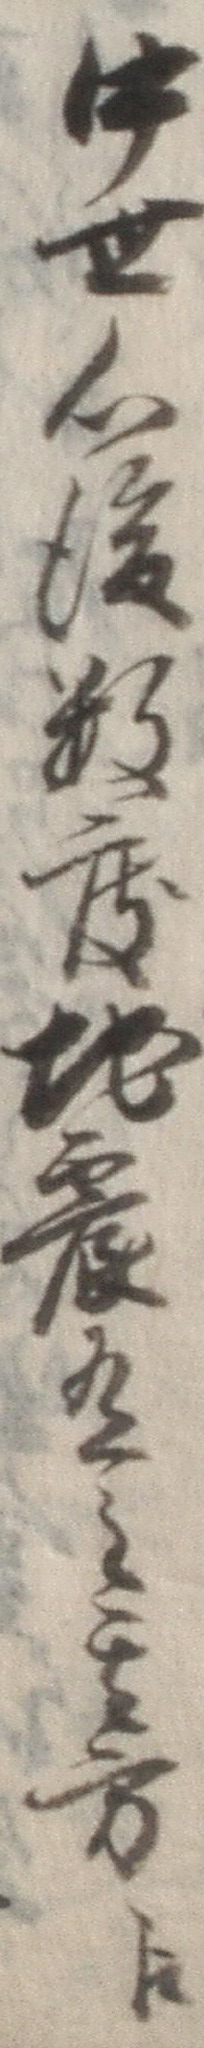中世以後数度地震有之其方え
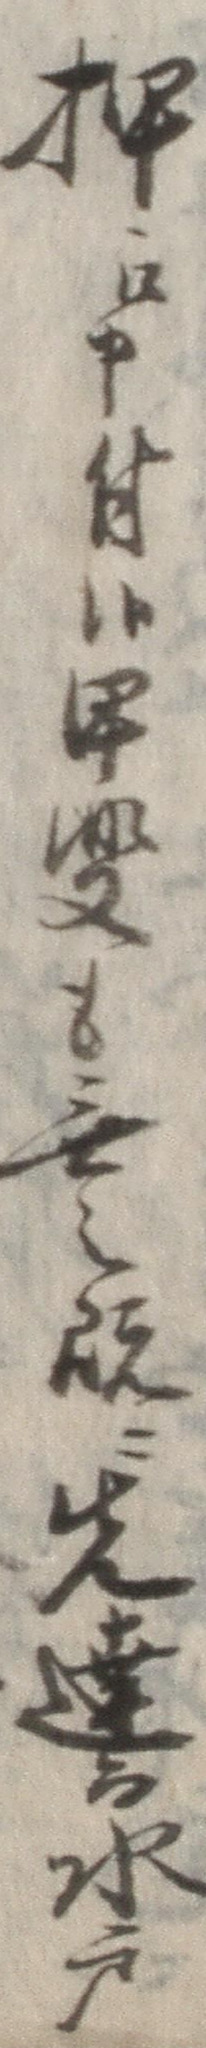押被被申付候甲斐も無之既二先達而水戸
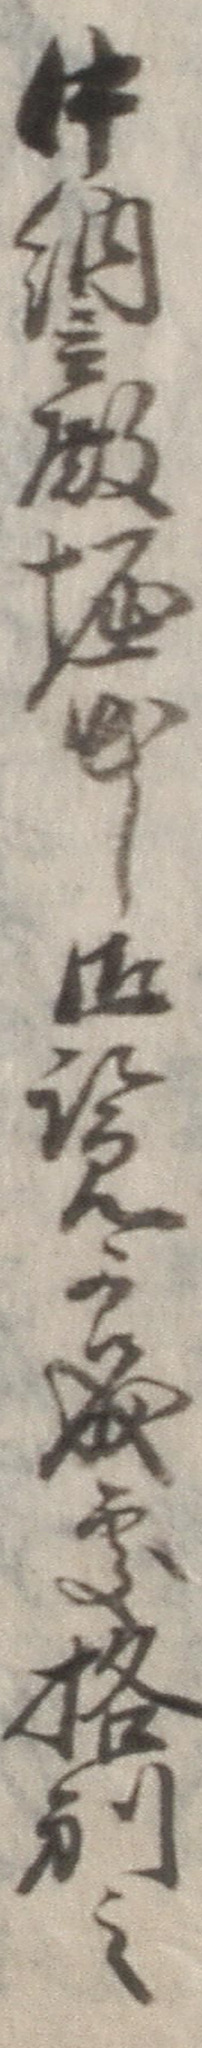中納言殿堀出し御覧可被成處格別之
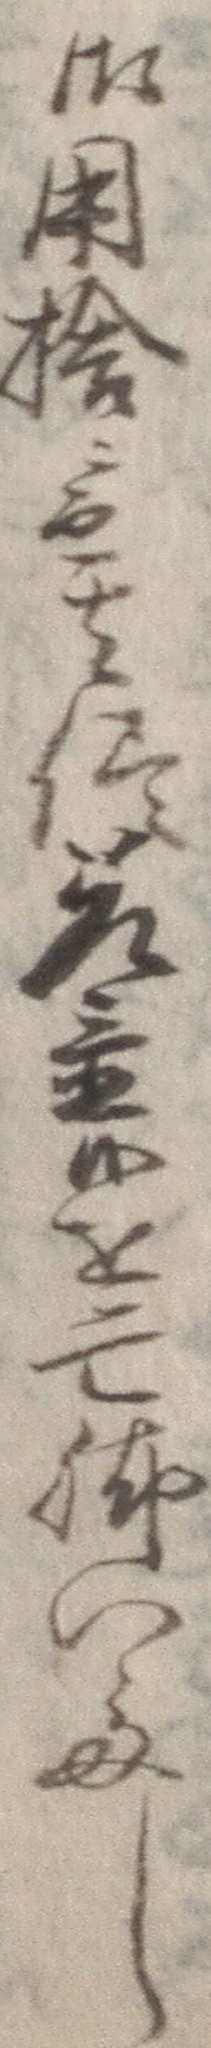御用捨二而其後差置候を亡脚いたし
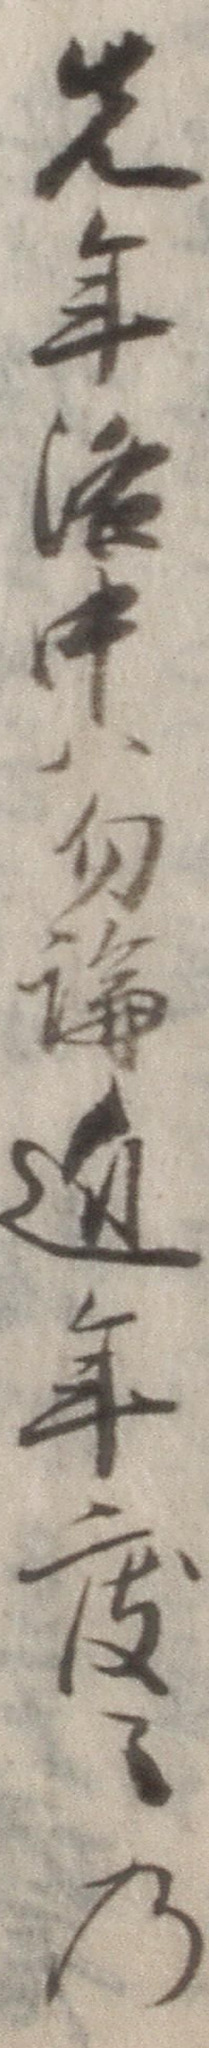先年洛中は勿論近年度々乃
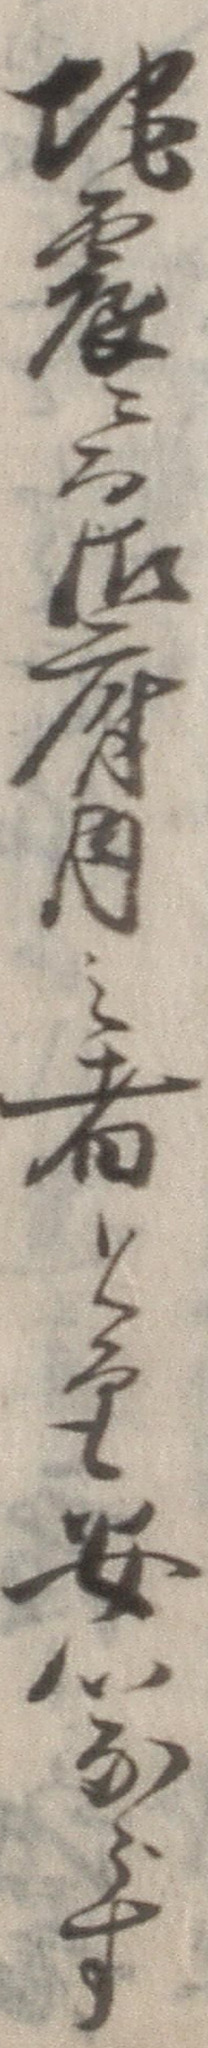地震二而御府内之者と而も安心ならす
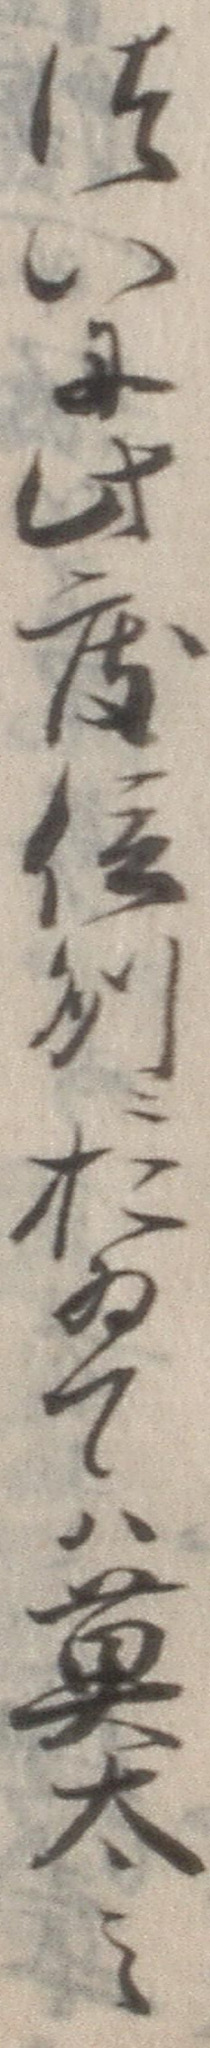ついに此度信州二おゐてハ莫大之
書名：[善光寺地震に関する冊子]
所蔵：東京大学地震研究所図書室 Earthquake Research Institute Library, The University of Tokyo, JAPAN
